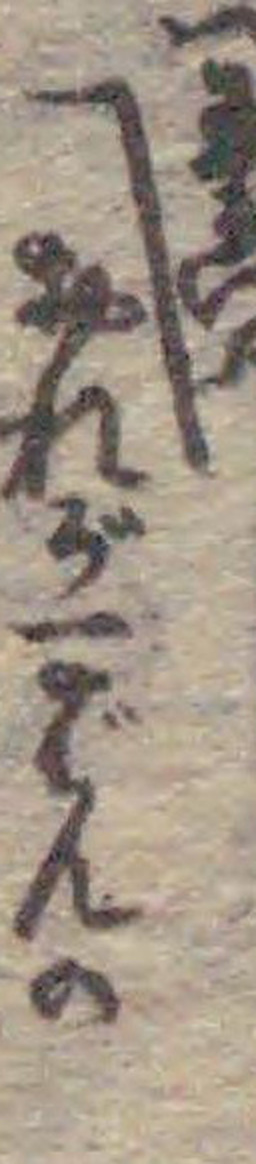〽おれが一ばんの
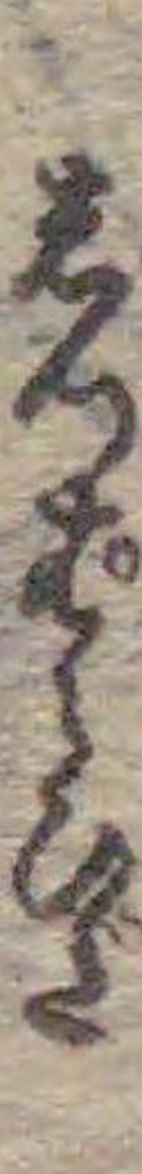しつぱらひだ
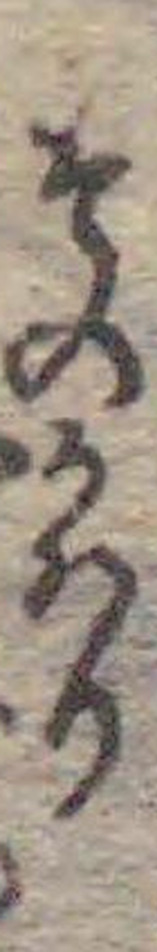そのかはり
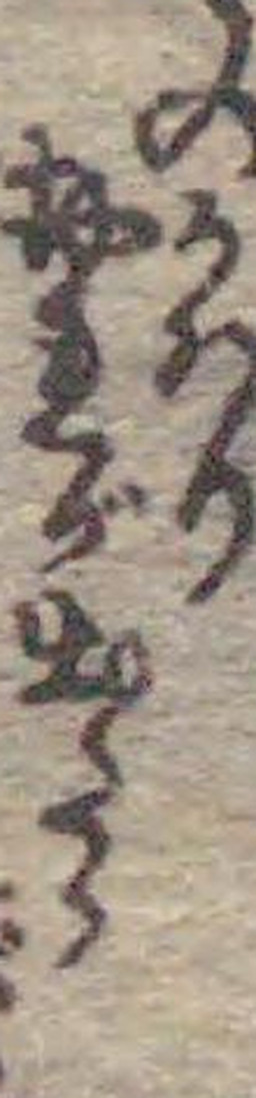おれが出たら
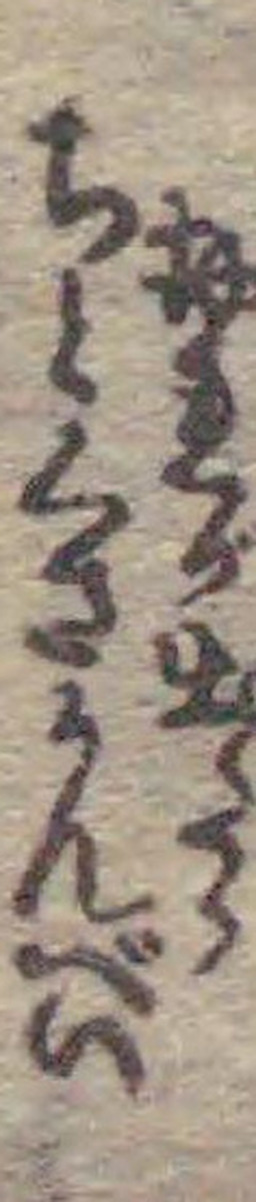ちとくさかんべい
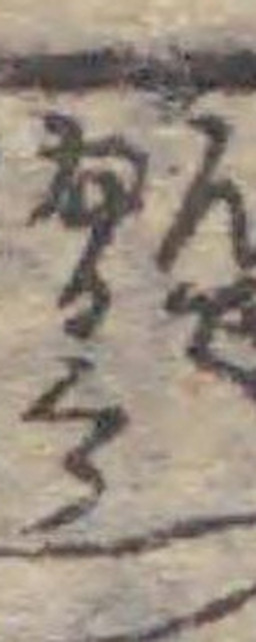ゐるくら
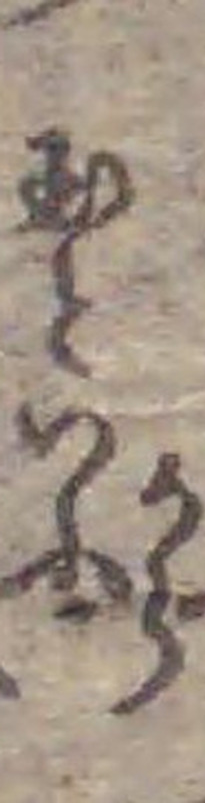玉といふ
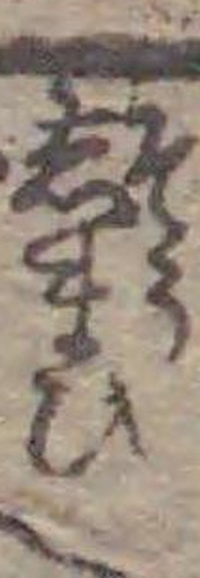しまひ
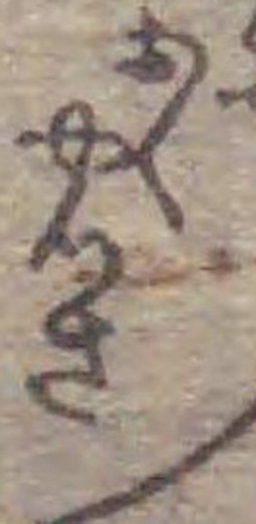やつさ
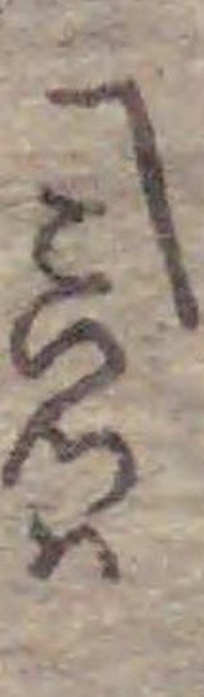〽こいつは
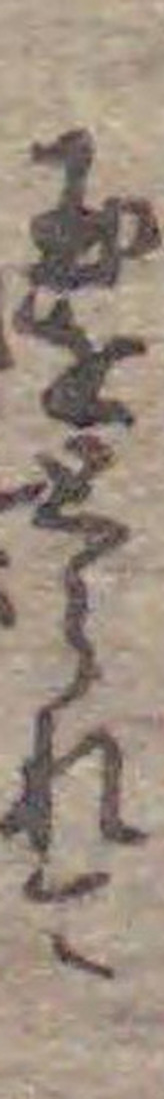玉をとられて
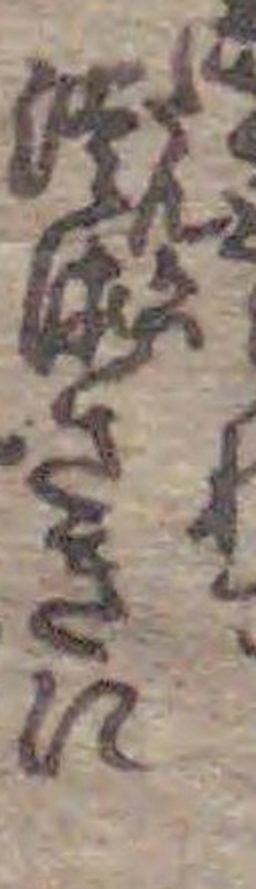淡海さきに
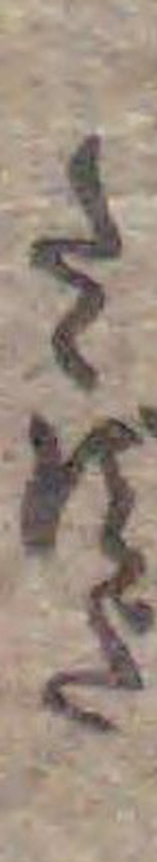たゝずだ
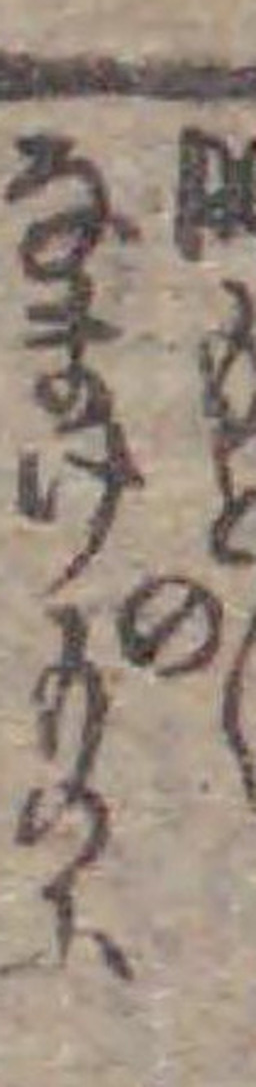なまけものに
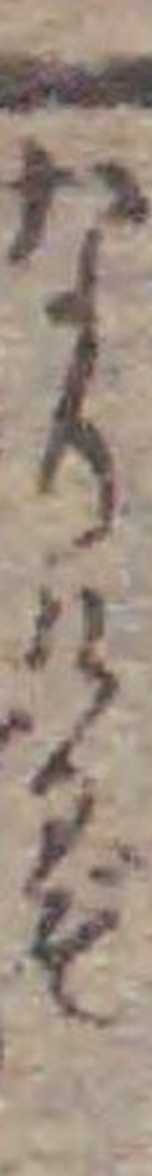なりけるぞ

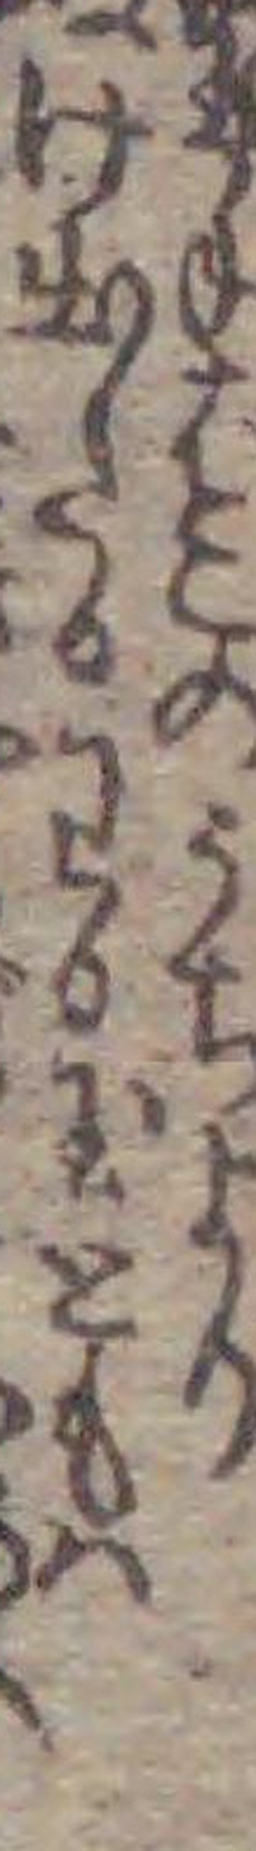ぬけ出たるわる玉ともは
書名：四遍搨心学草帋 : 3巻
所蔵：国立国会図書館 National Diet Library, JAPAN
